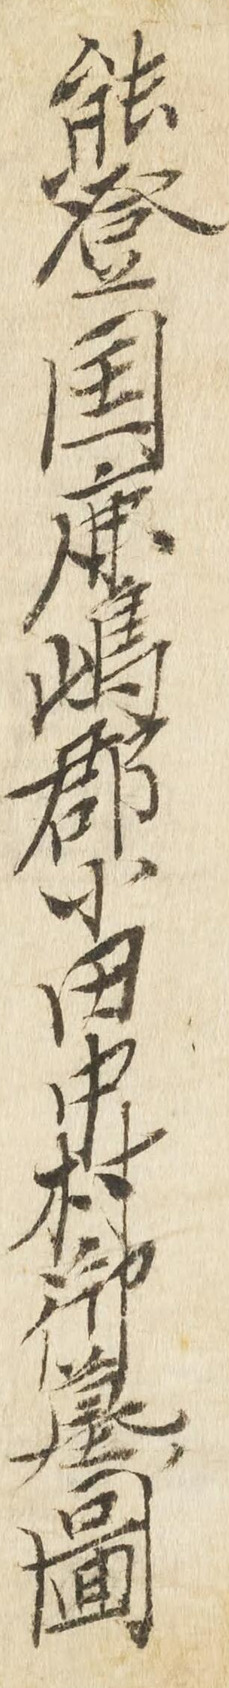能登国鹿嶋郡小田中村御墓ノ図

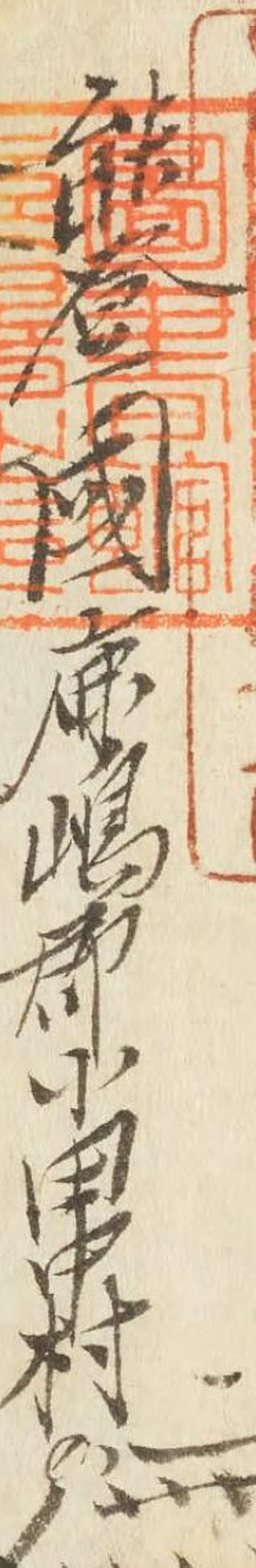能登国鹿嶋郡小田中村
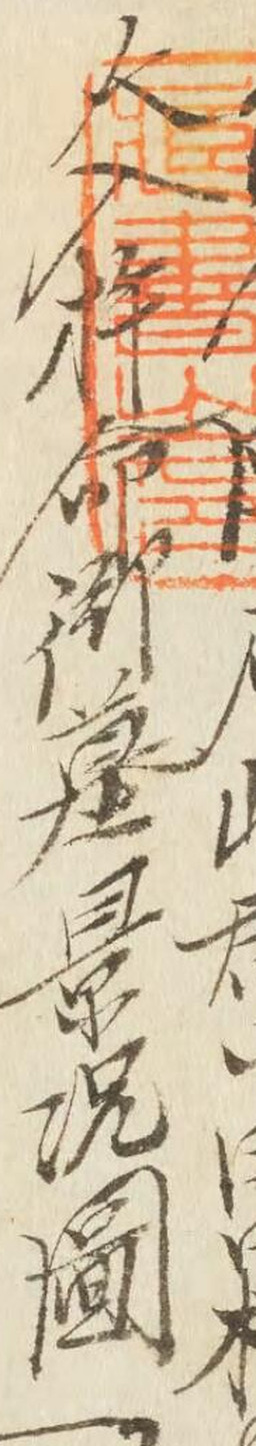大入杵命御墓景況図
